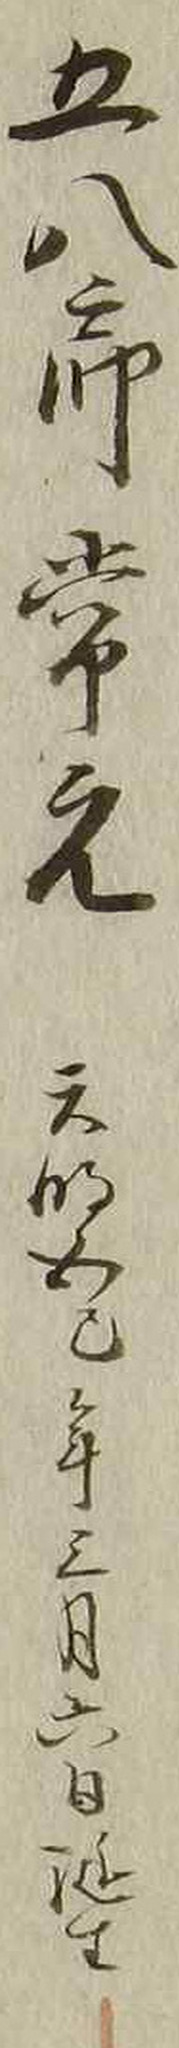五八郎常元天明五巳年三月六日誕生
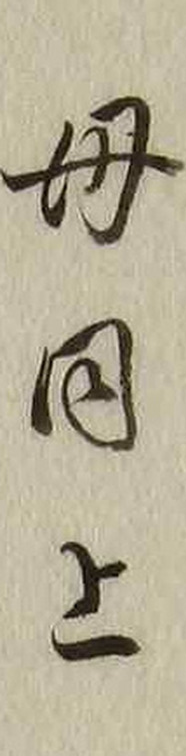母同上
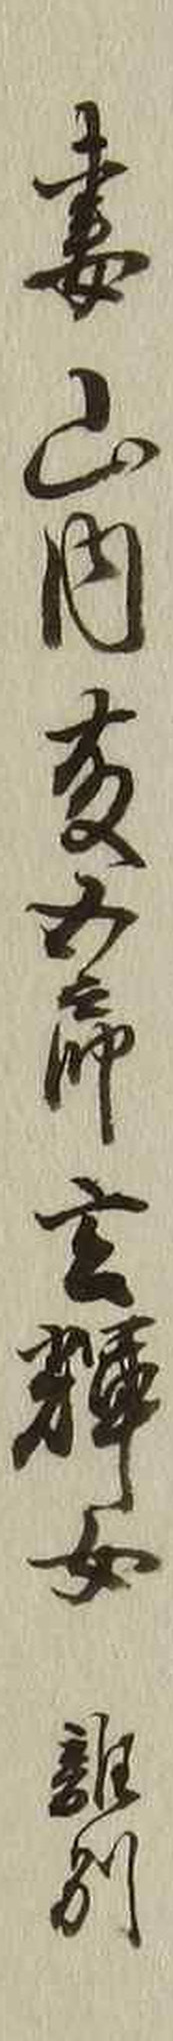妻山内藤五郎玄輝女離別
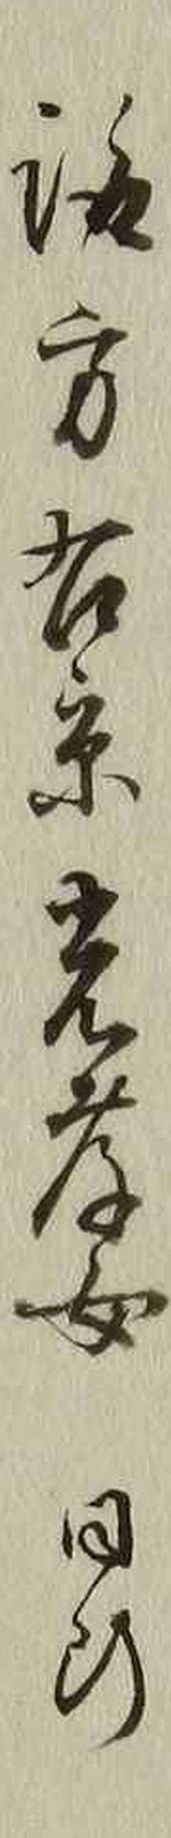路方右京光孝女同断
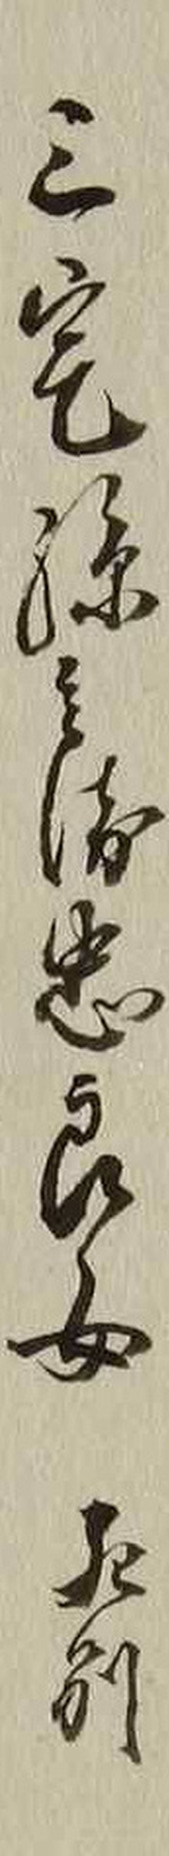三宅孫兵衛忠良女死別
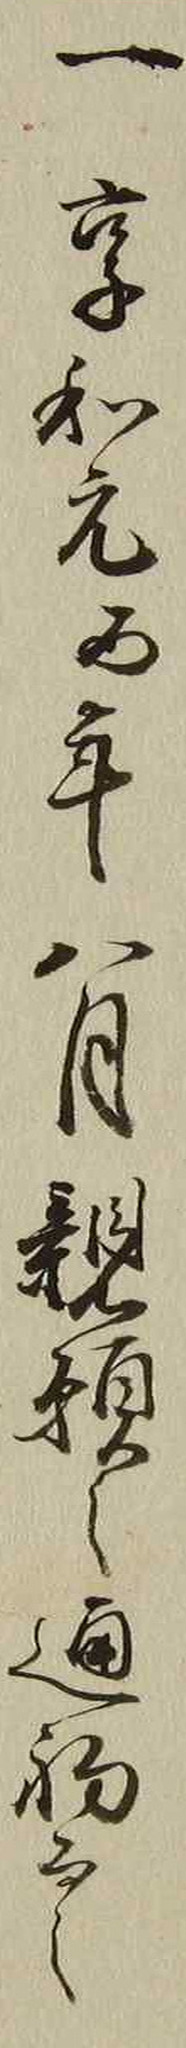一享和元酉年八月親願之通初而之
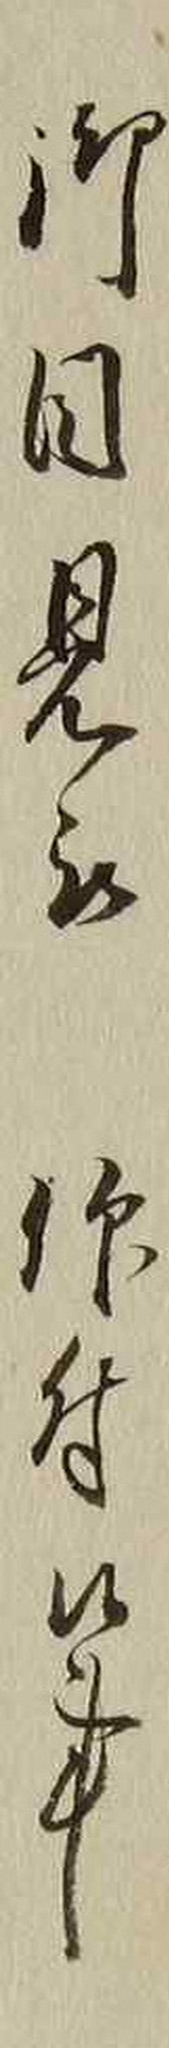御目見被仰付候事
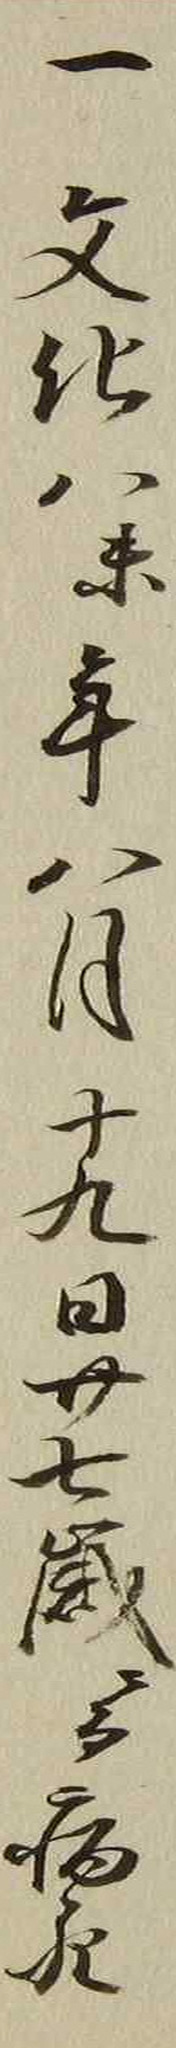一文化八未年八月十九日廿七歳ニ而病死
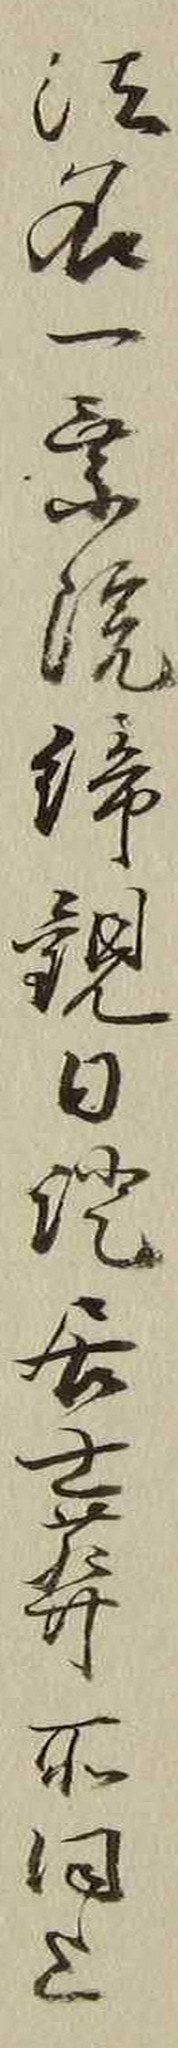法名一乗院締観日証居士葬所同上
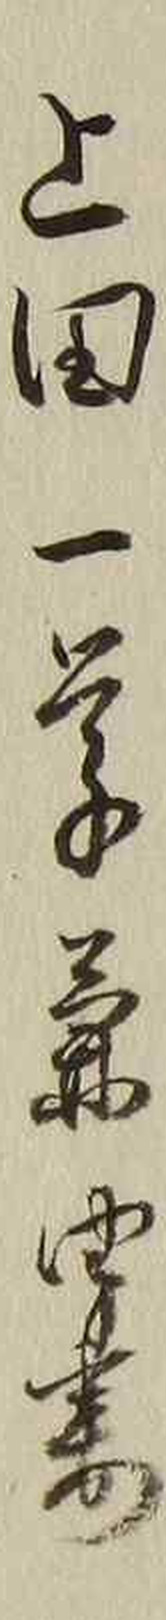上田一学兼由妻
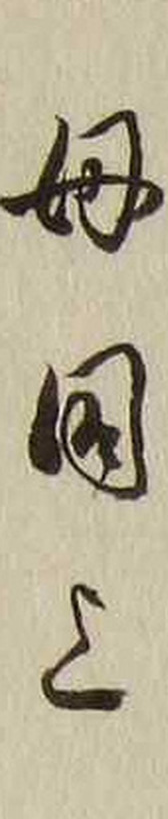母同上

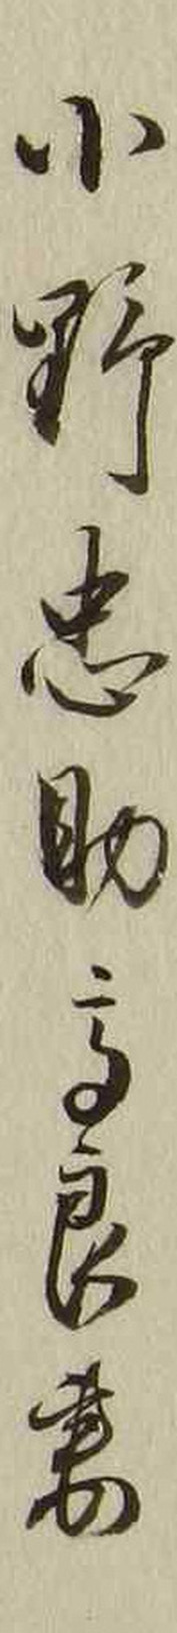小野忠助高良妻
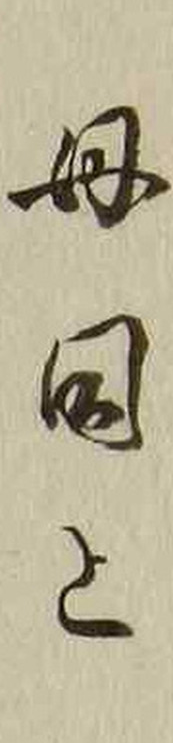母同上
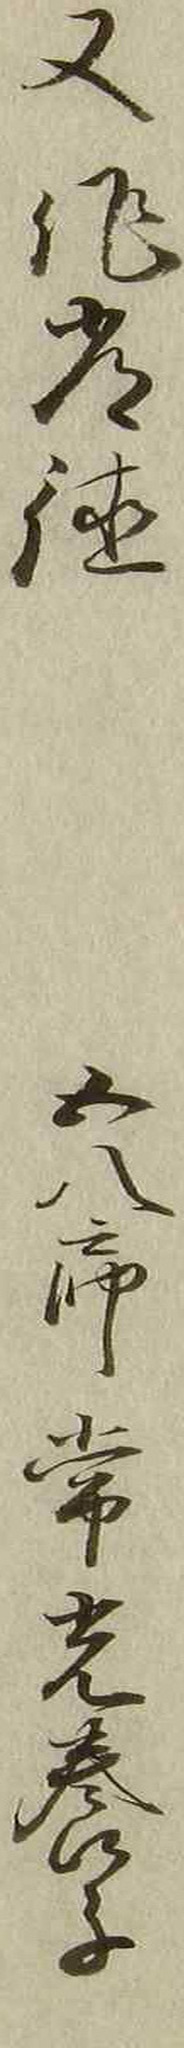又作常徳五八郎常光養子
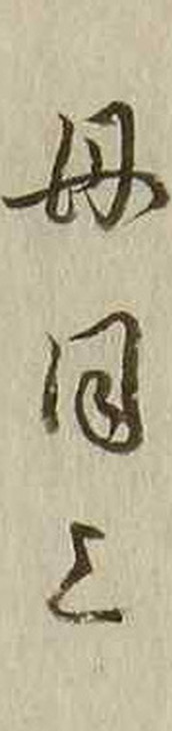母同上
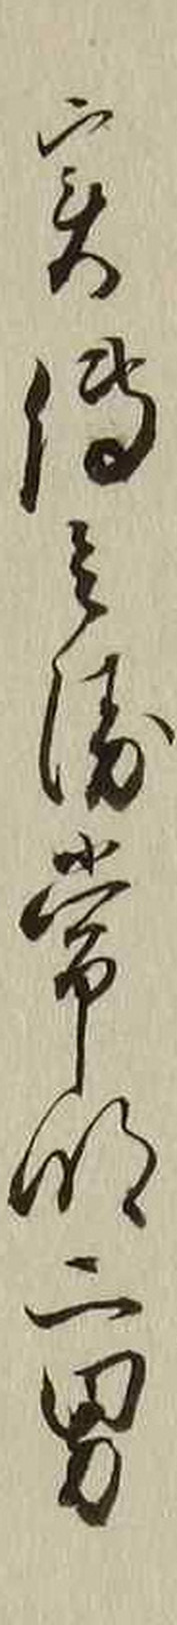実伝兵衛常明二男
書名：諸士系譜　巻之122　よ之部5
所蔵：会津若松市立会津図書館
